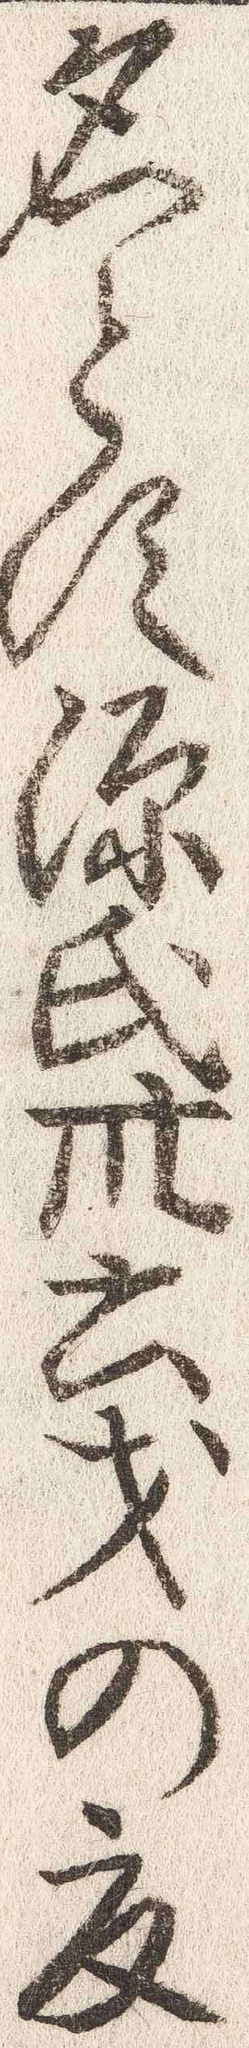名とす源氏卅六才の夏
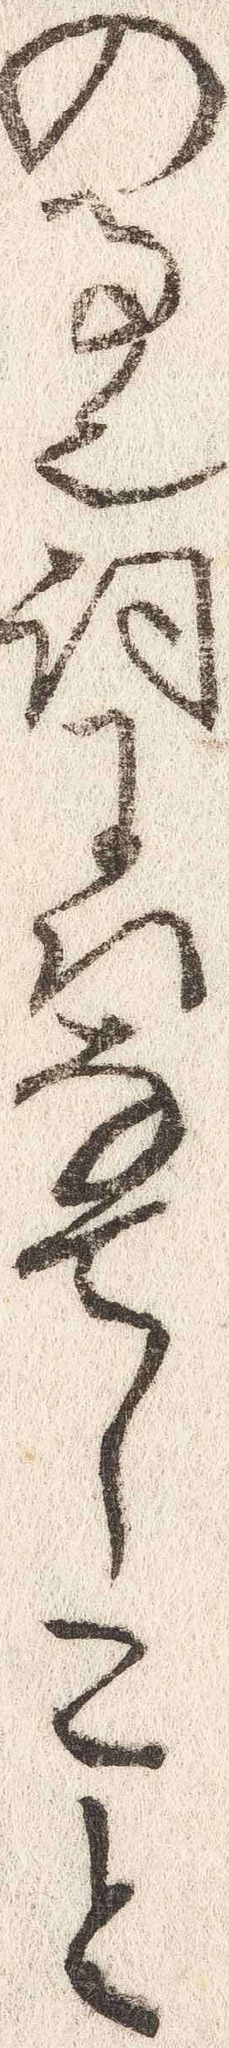の事也詞にはなてしこと
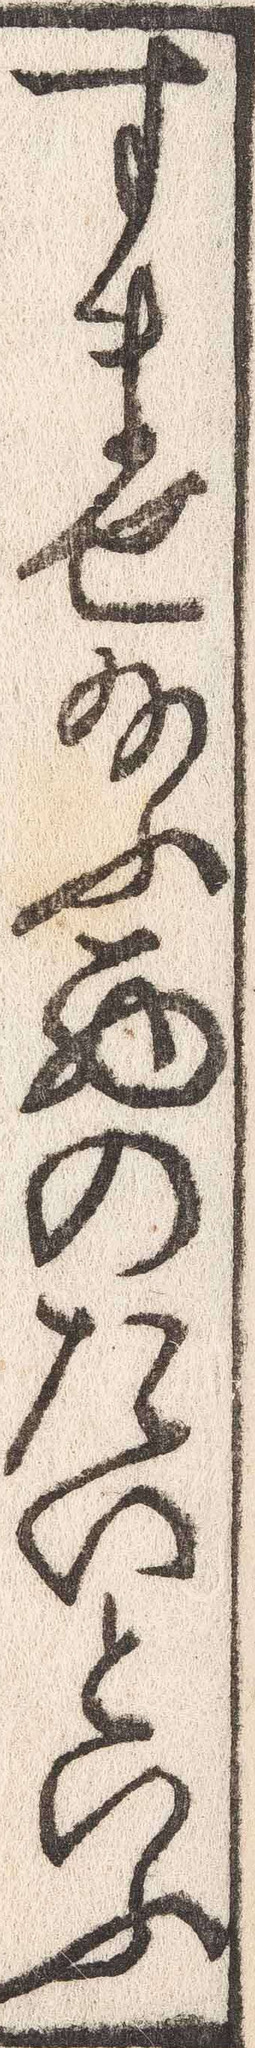すませ給ふ西のたいといふ
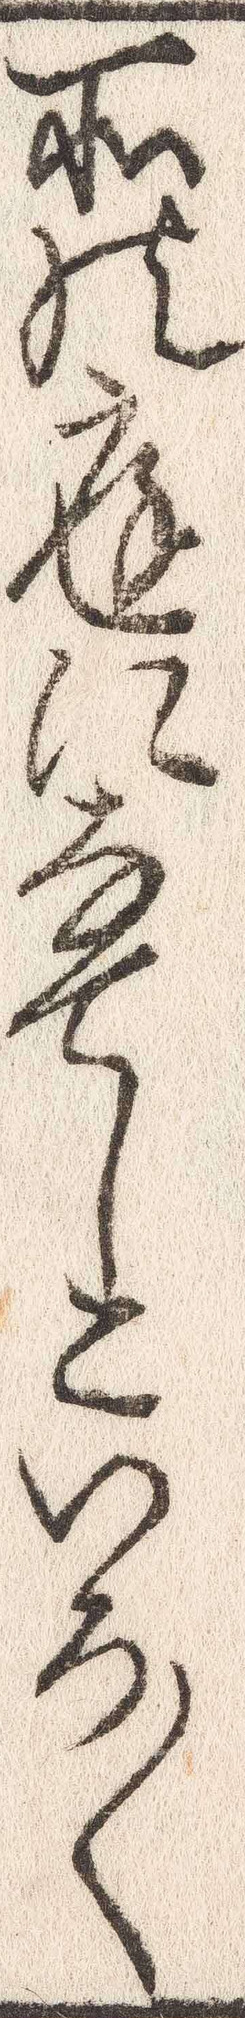所の庭になてしこいろ〳〵
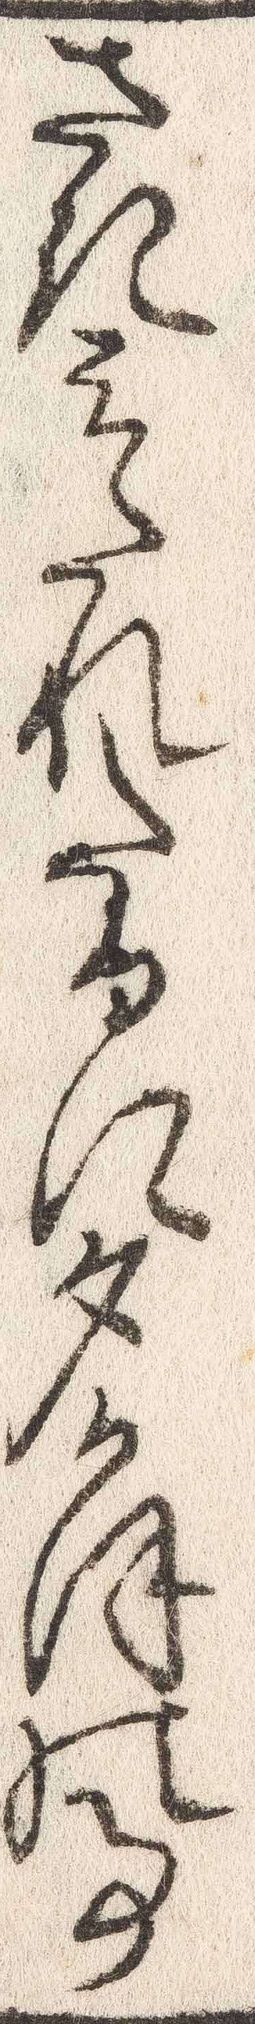さきみたれたるに夕かほの事
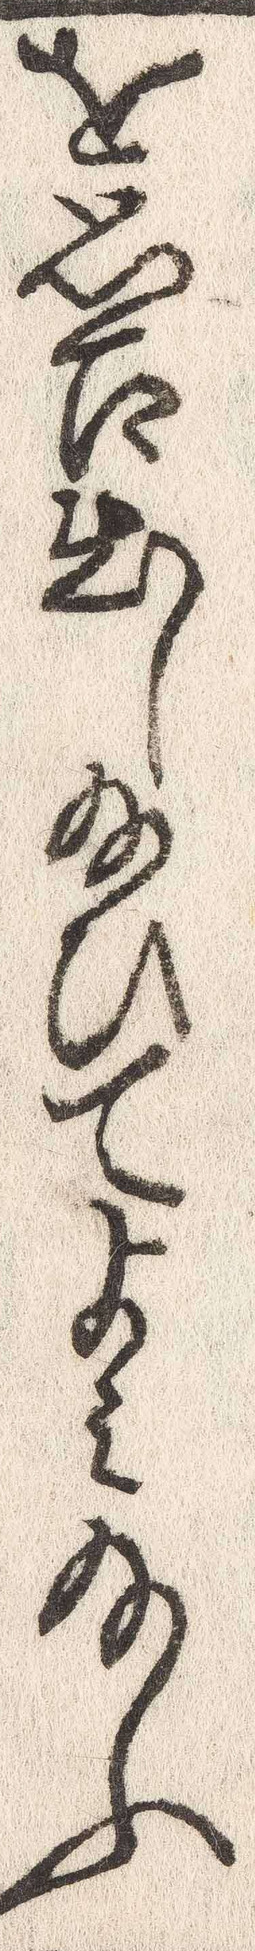を思召出し給ひてよみ給ふ
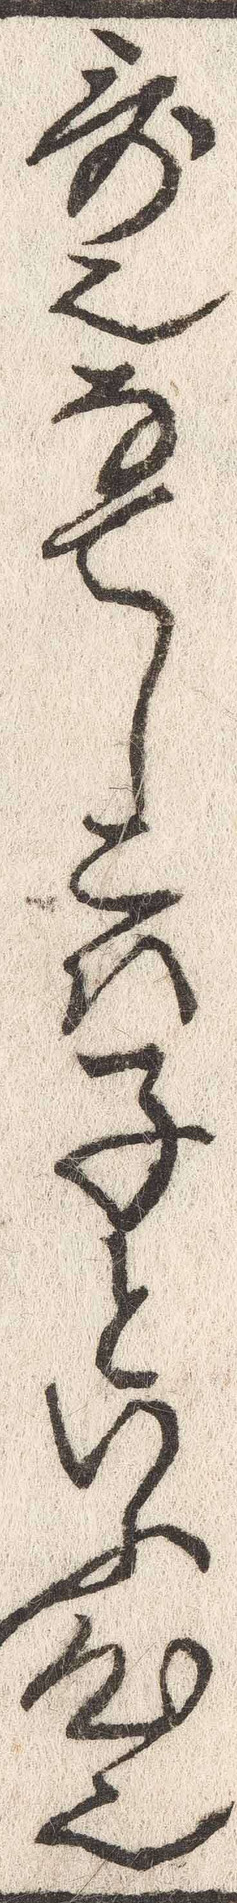歌也なてしこは子といふ心也

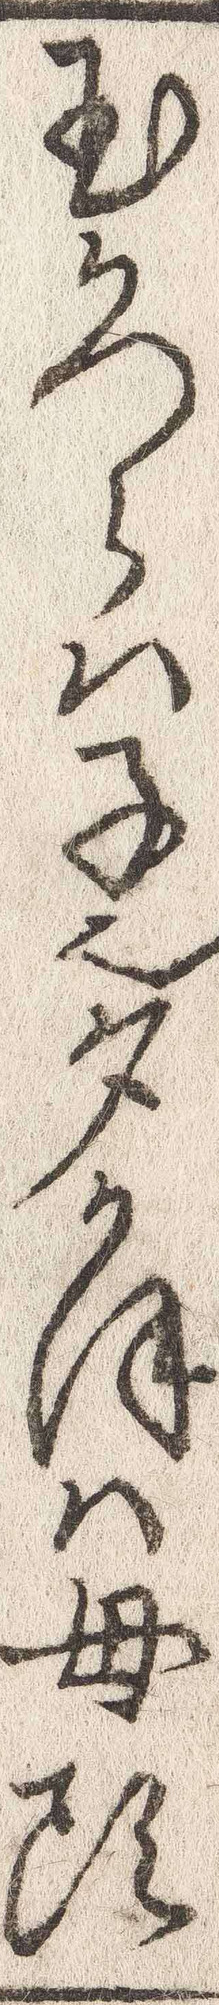玉かつらは子也夕かほは母頭
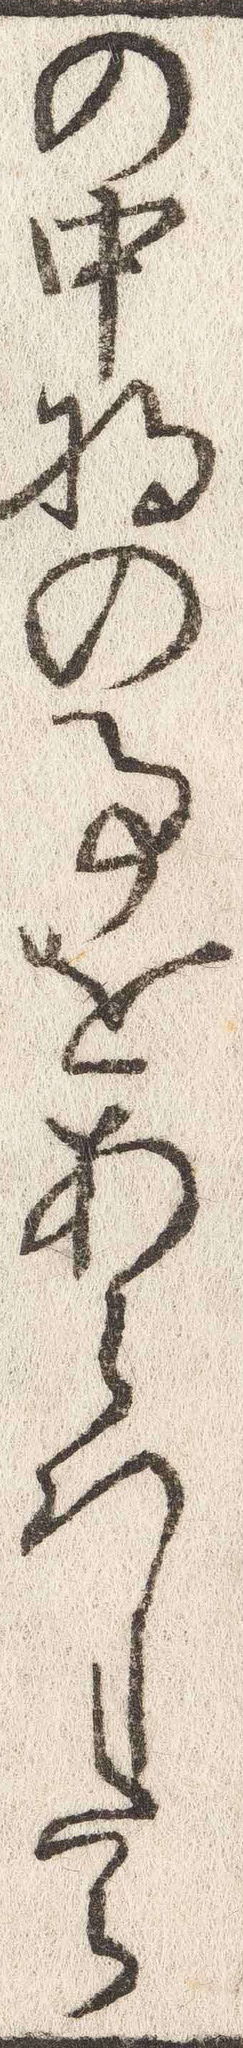の中将の事をあらはしたら
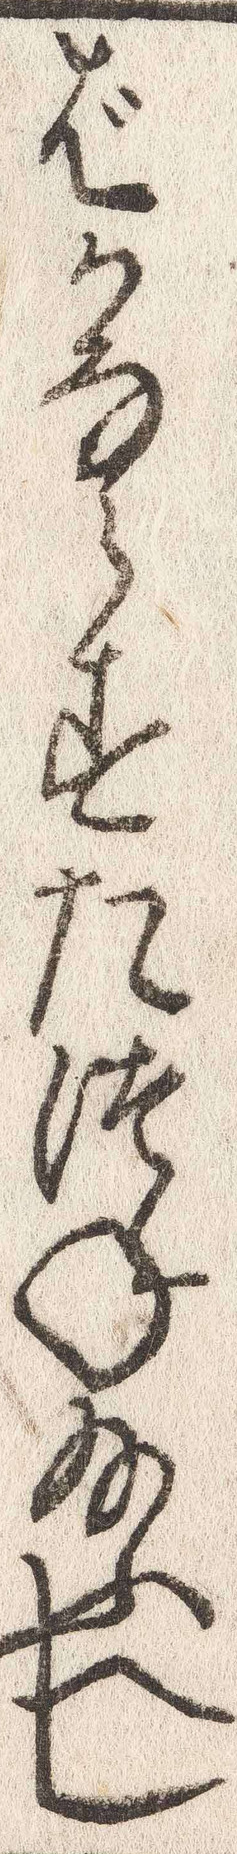ばかならすたつね給ふへし
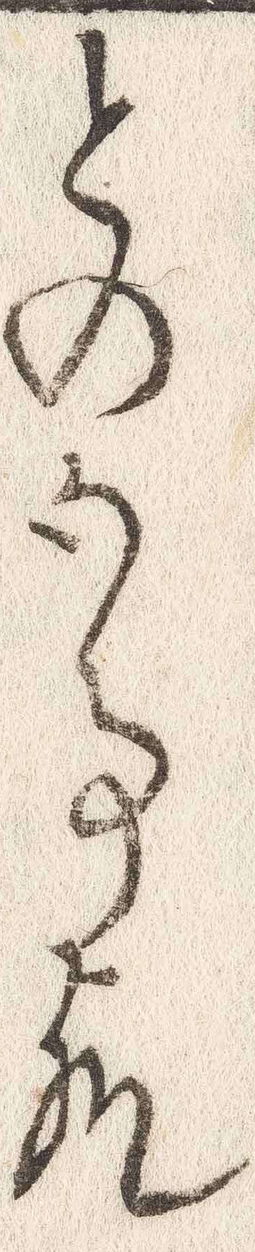との御事歟
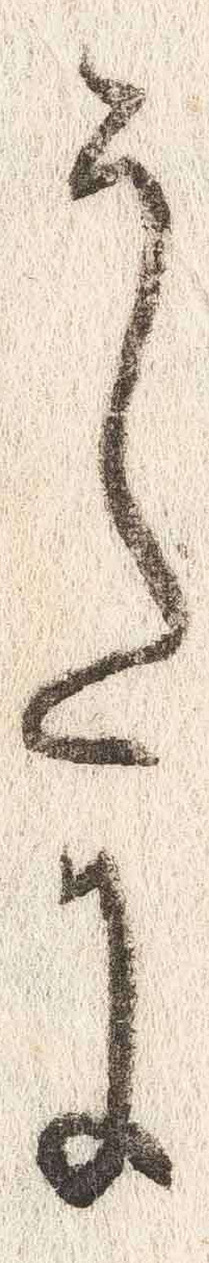うたに
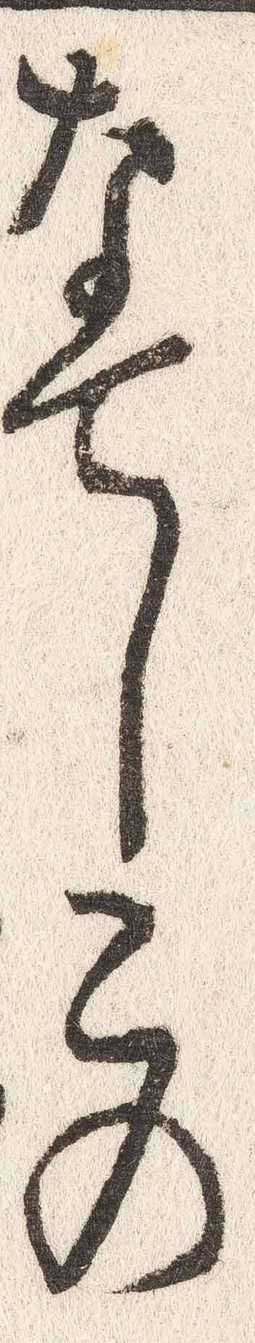なてしこの
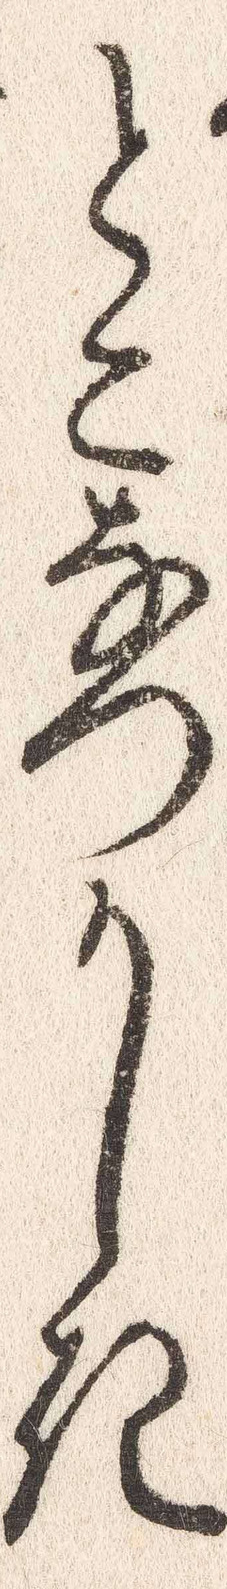とこなつかしき
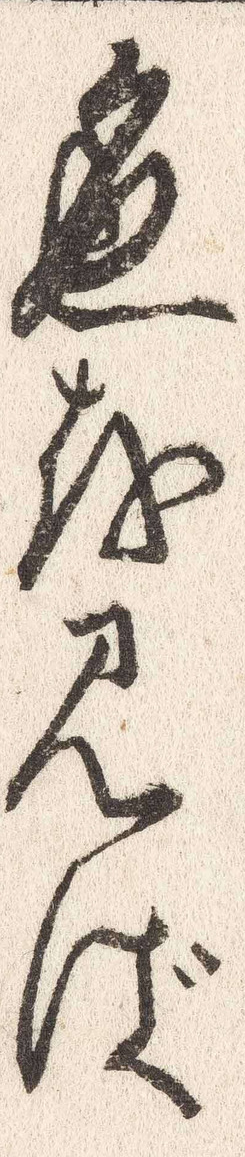色を見ば
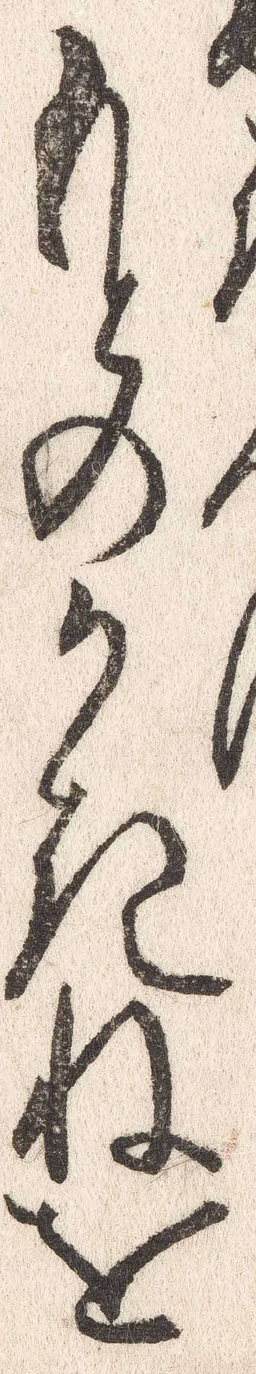もとのかきねを
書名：源氏物語
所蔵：東京学芸大学附属図書館 国文学研究資料館
